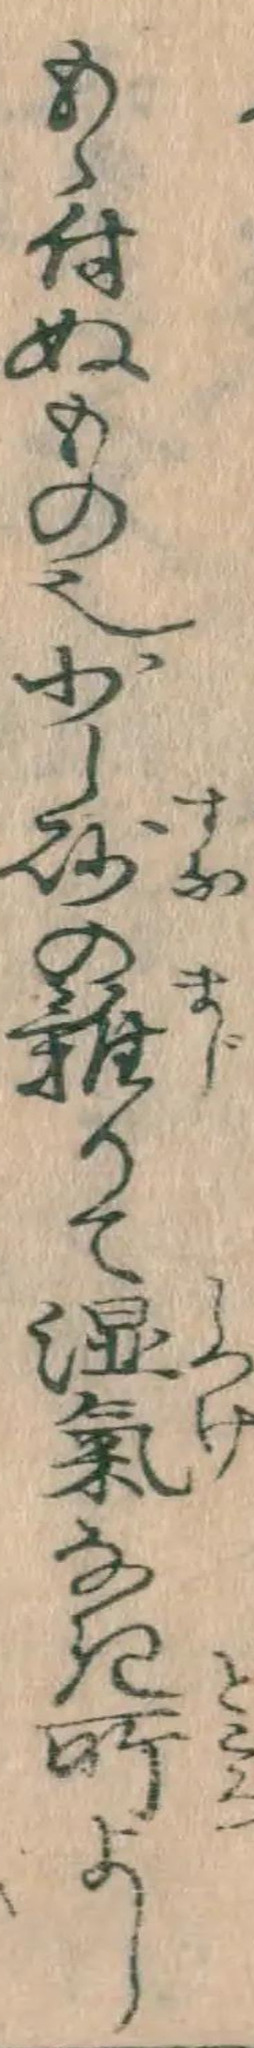もゝ付ぬもの也少し砂の雑りて湿気なき所よし
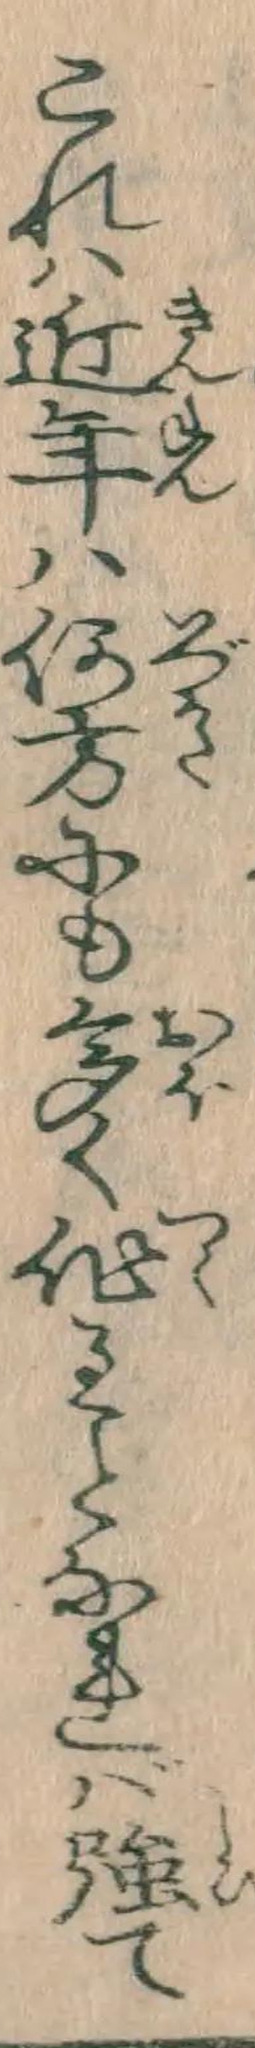これは近年は何方にも多く作ることなれば強て
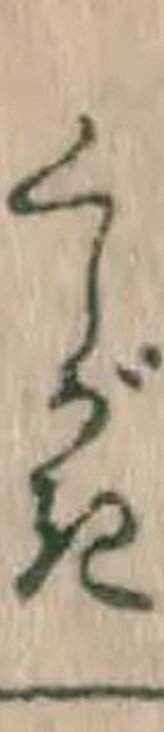くしがき
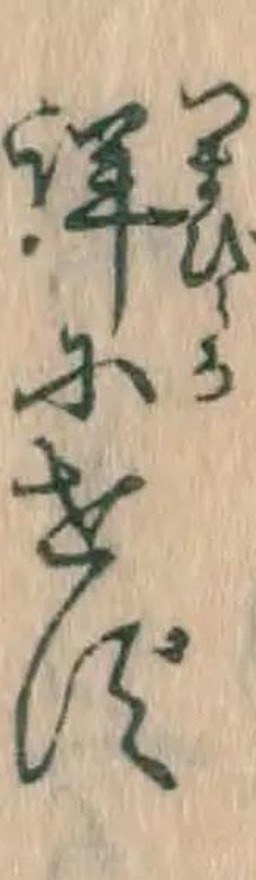詳にせず
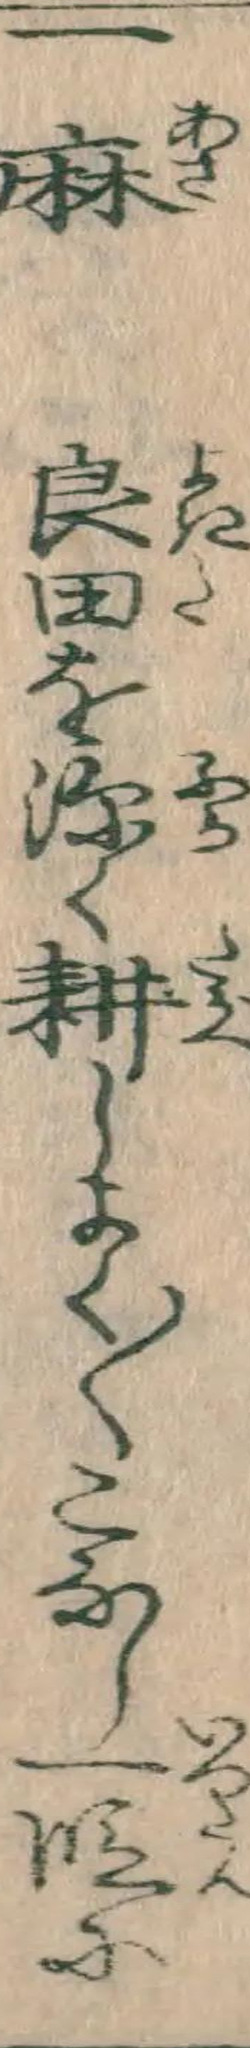一麻良田を深く耕しよく〳〵こなし一段に
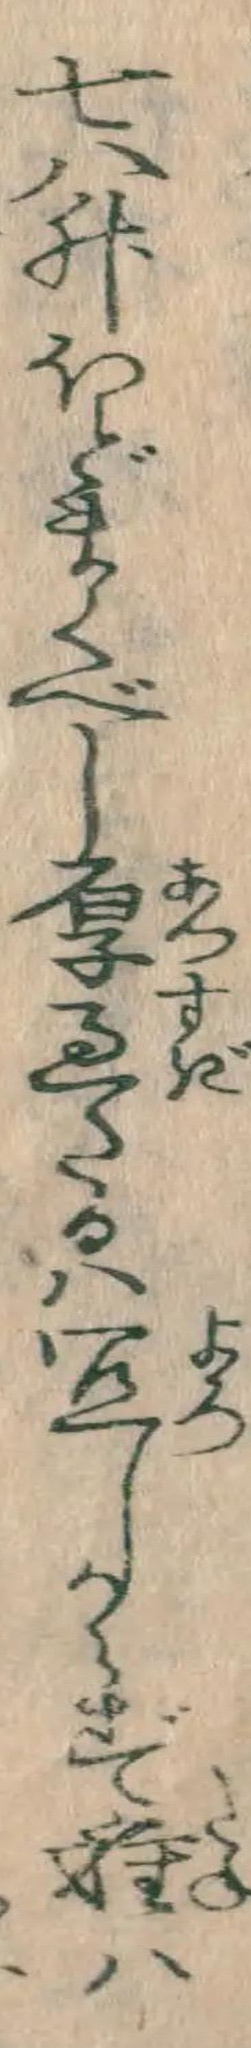七八升ほどまくべし厚過たるは宜しからず種は
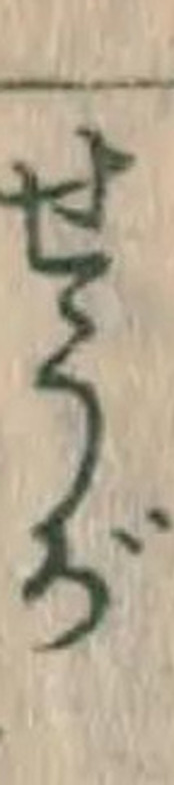せうが
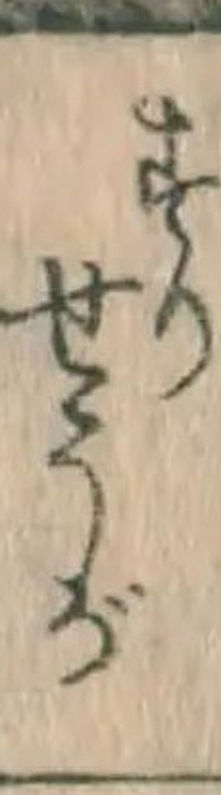せうが
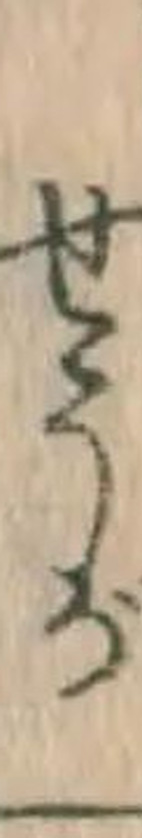せうが
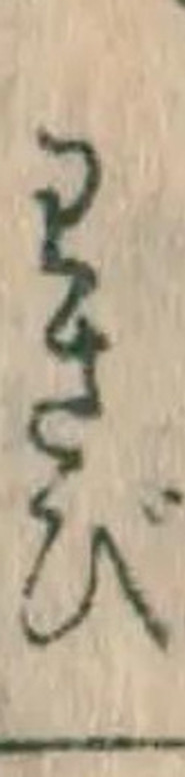わさび
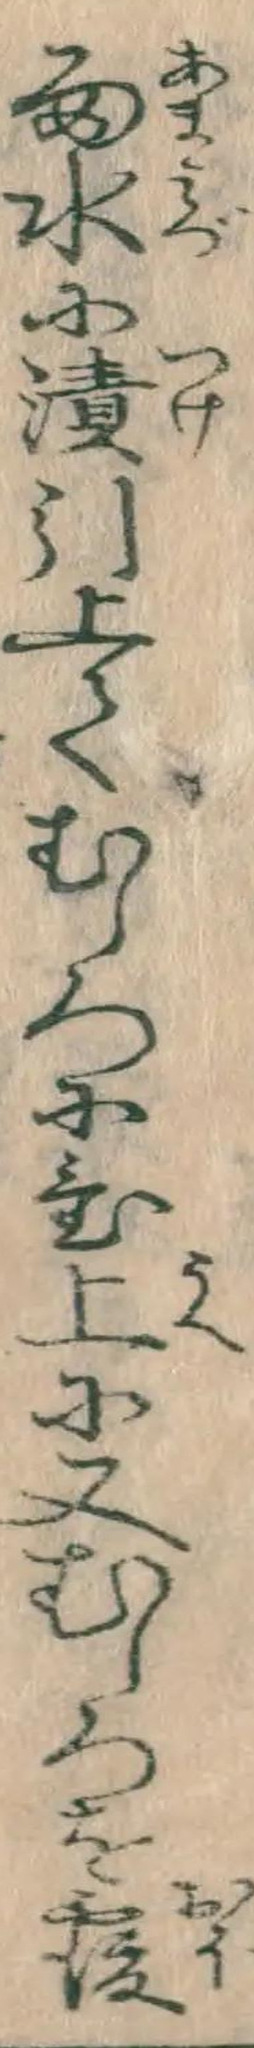雨水に漬引上てむしろに置上に又むしろを覆
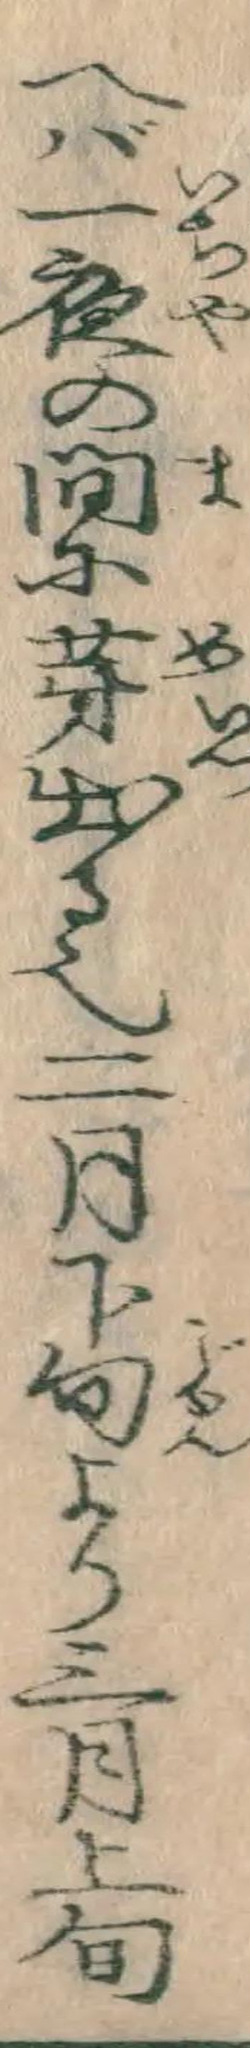へば一夜の間に芽出る也二月下旬より三月上旬
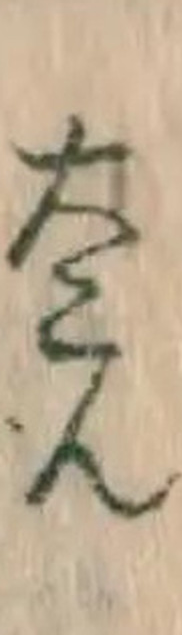大こん
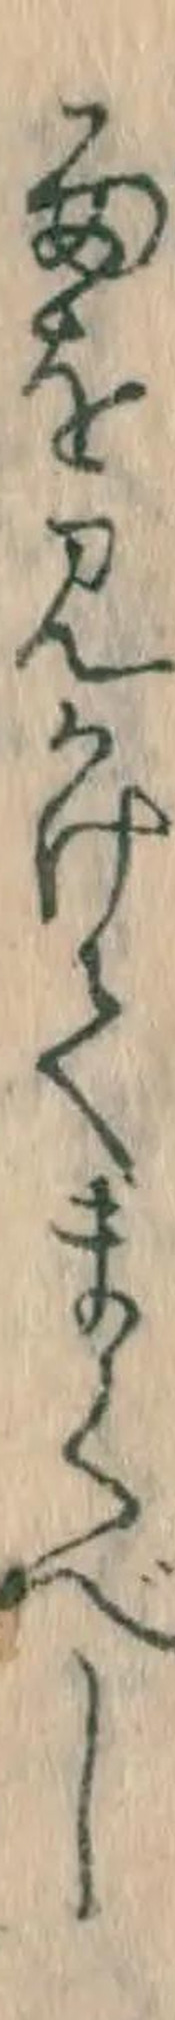雨を見かけてまくべし
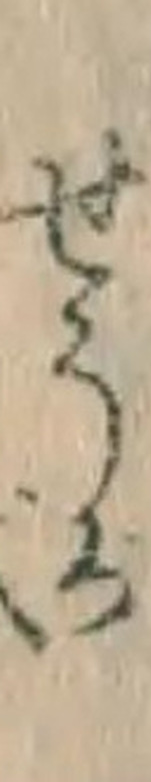せうが
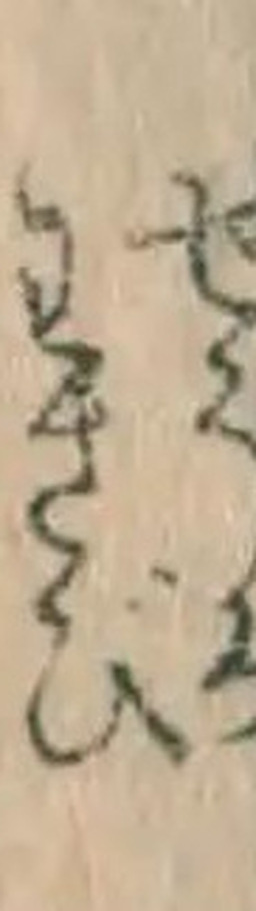わさび
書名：広益秘事大全 3巻. [5]
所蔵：国立国会図書館 National Diet Library, JAPAN
